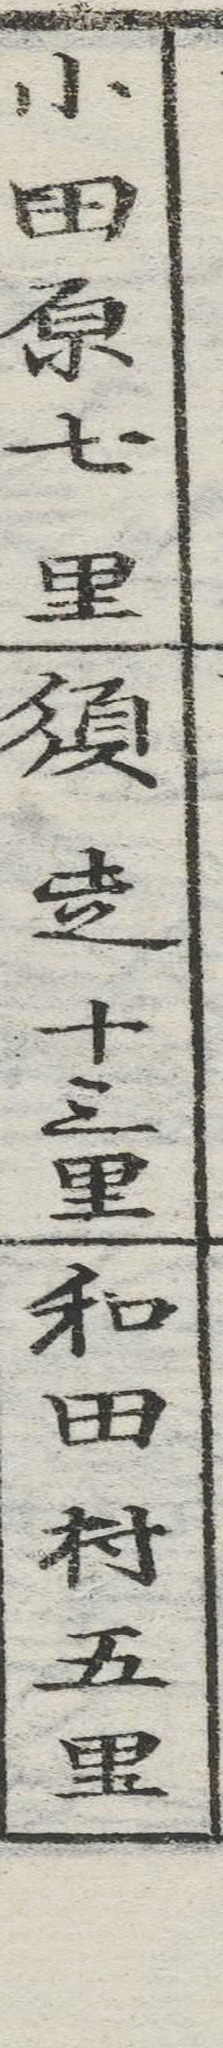小田原七里須走十三里和田村五里
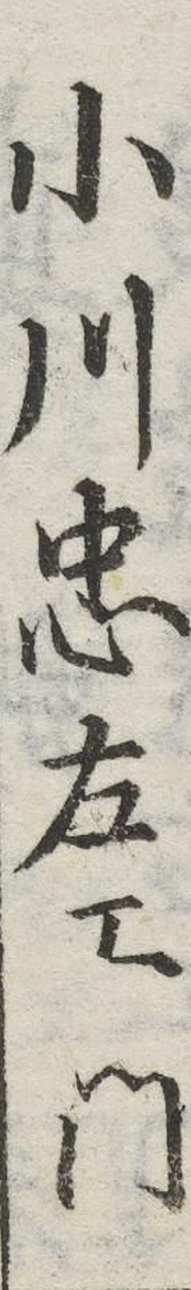小川忠左エ門
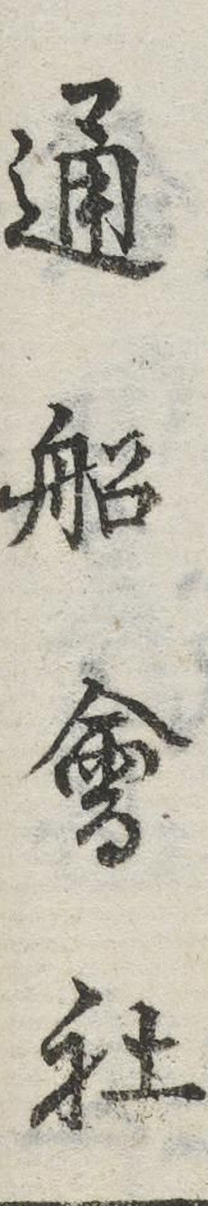通船会社
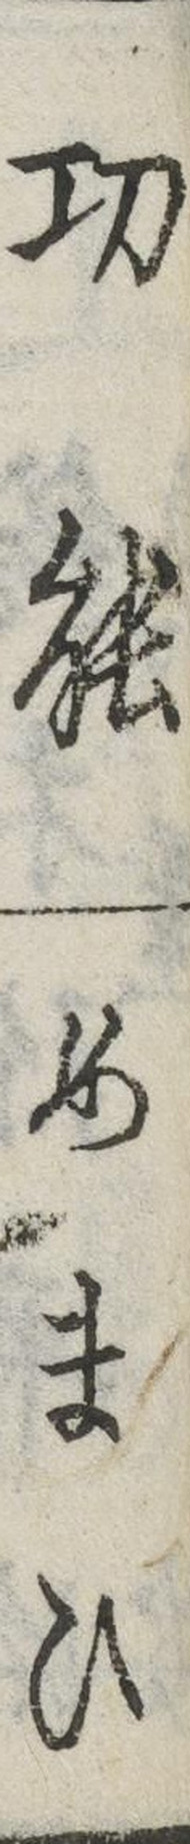功能めまひ
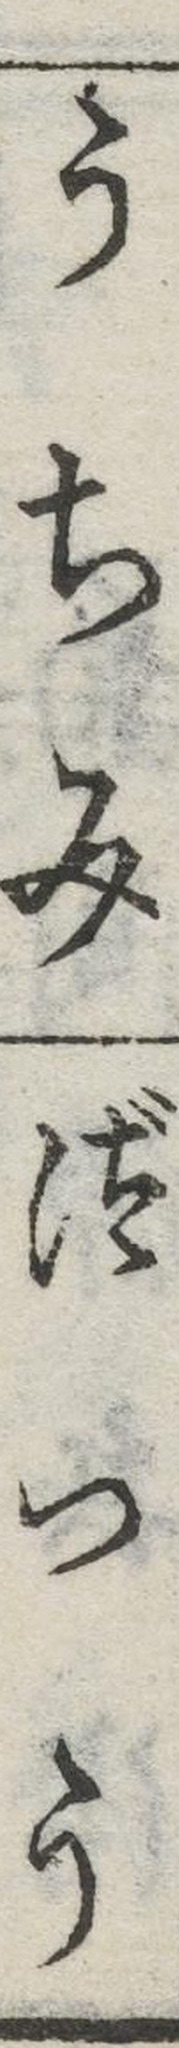うちみづつう
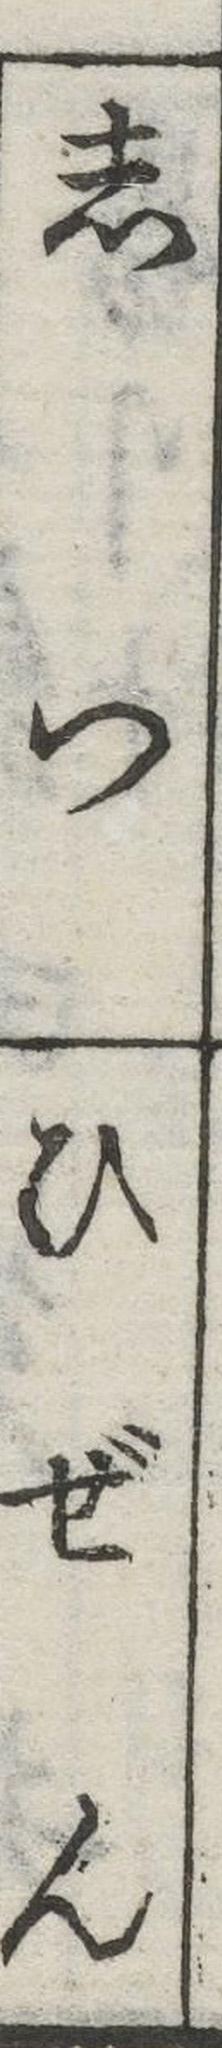しつひぜん
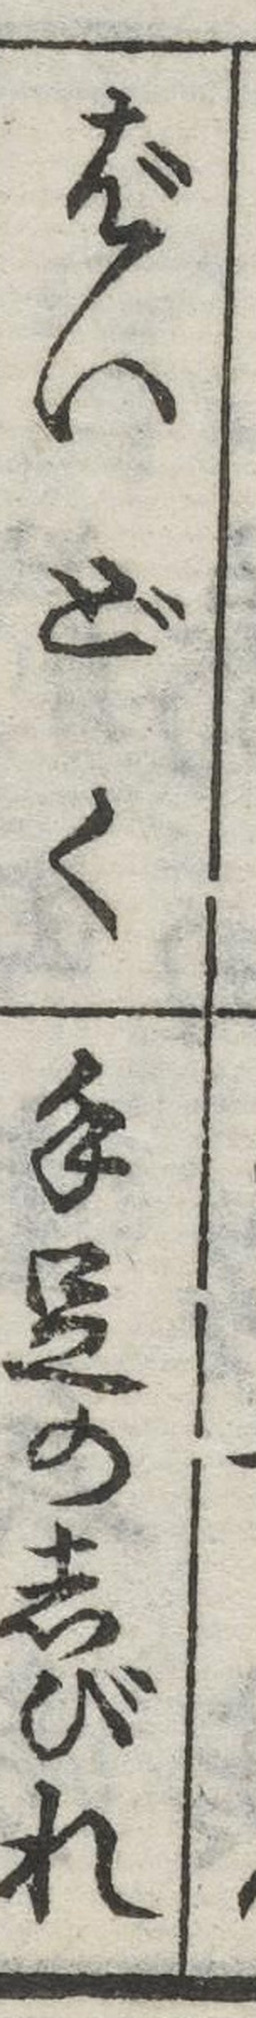ばいどく手足のしびれ
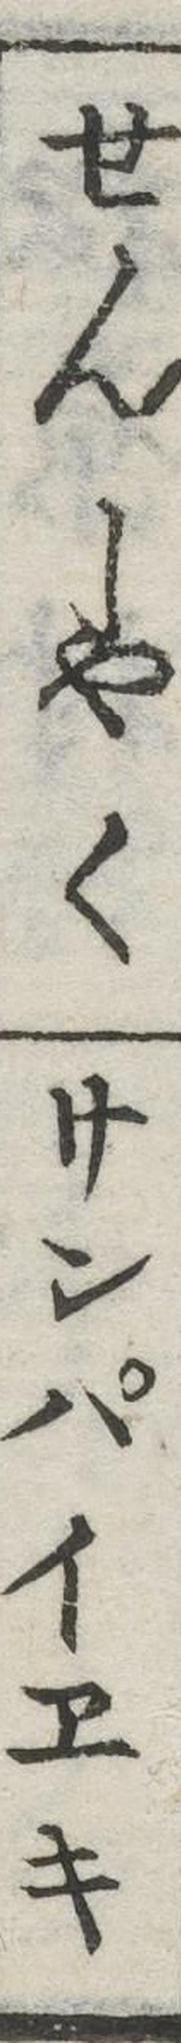せんしやくサンパイヱキ
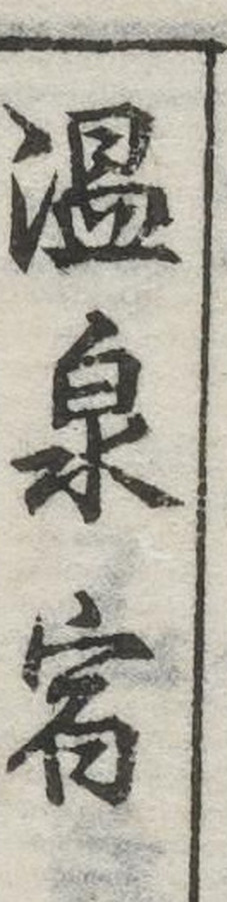温泉宿
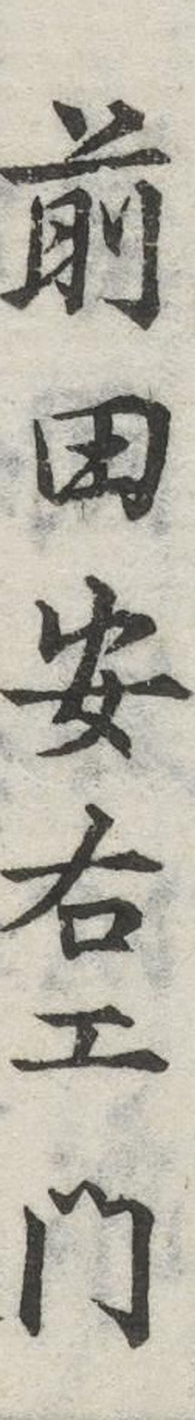前田安右エ門
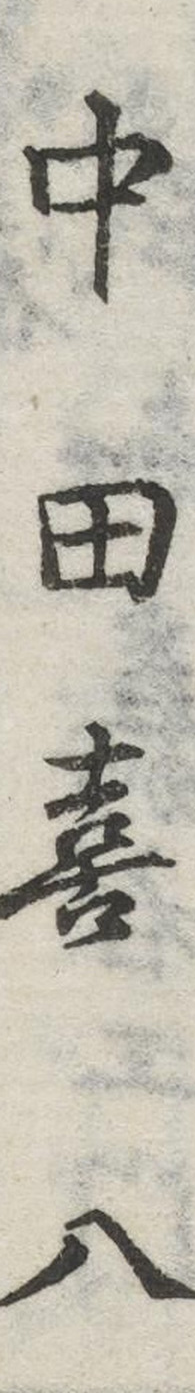中田喜八
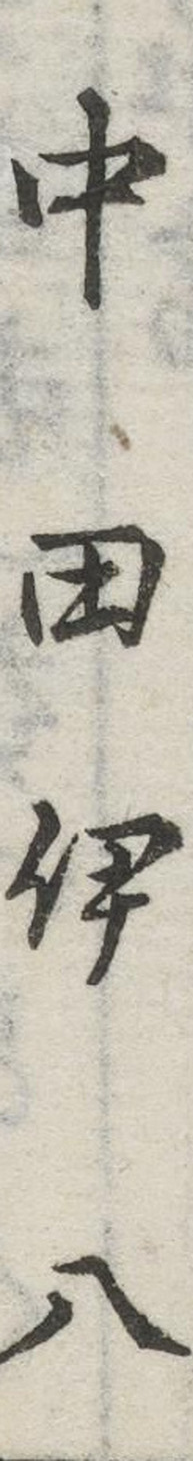中田伊八
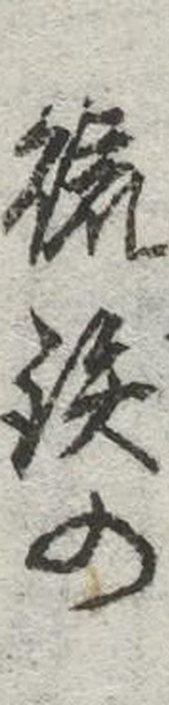硫鉄の
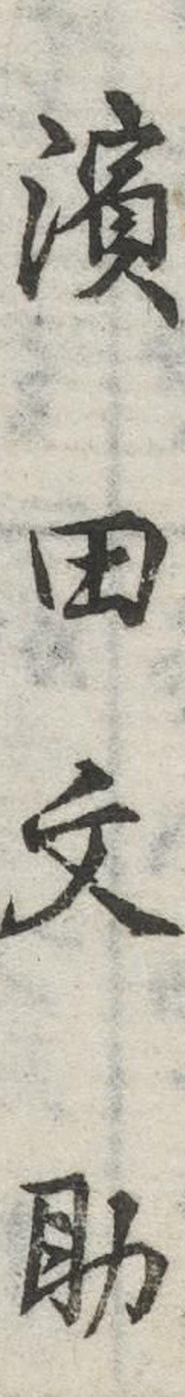浜田文助
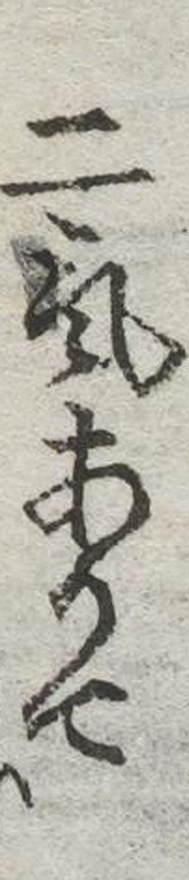二気ありて
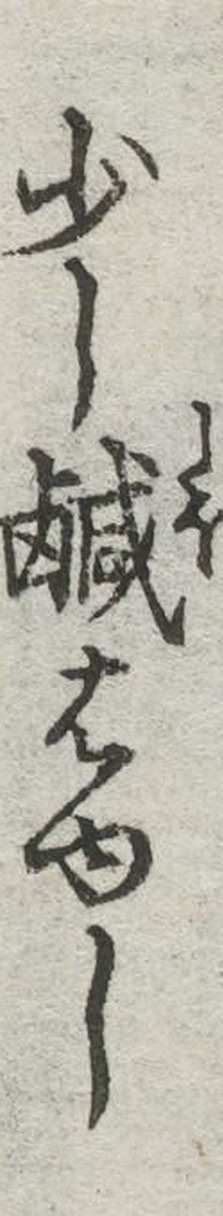少し鹹はゆし
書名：諸國温泉遊覽記　全
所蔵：東京大学地震研究所図書室 Earthquake Research Institute Library, The University of Tokyo, JAPAN
